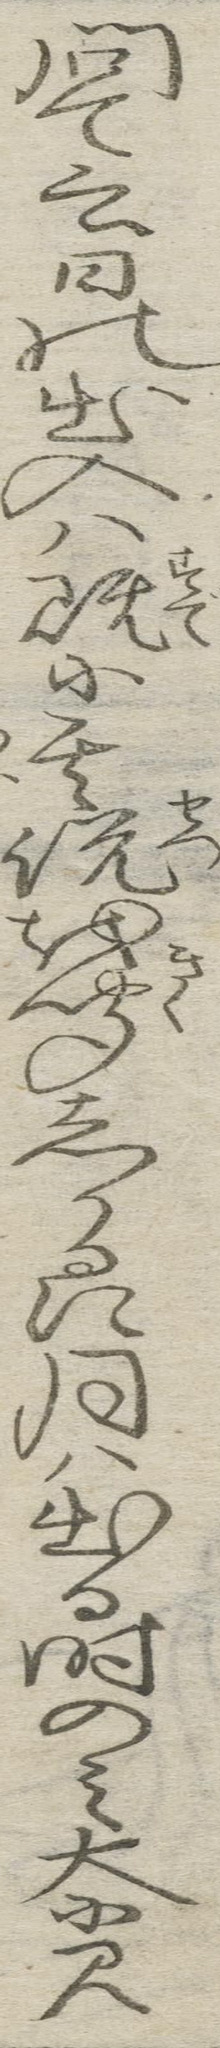問て云日の出入は既に其説を聞しかるに月は出る時のみ大に見
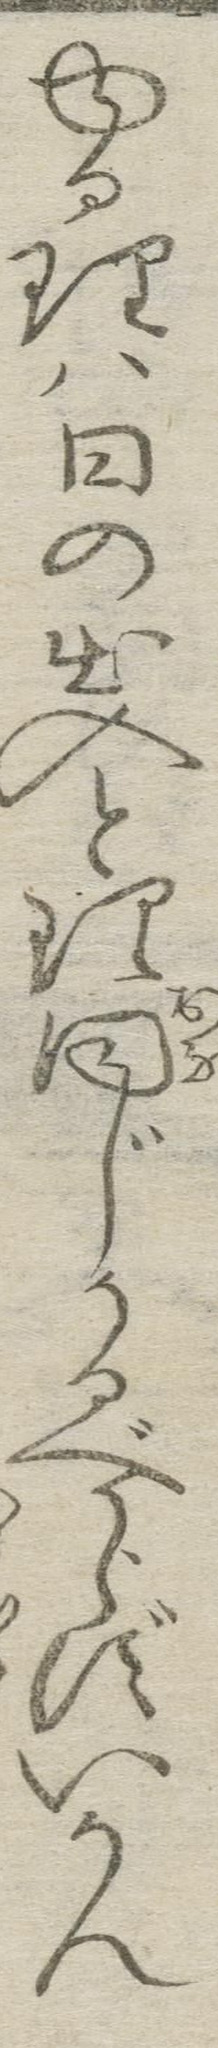ゆる理は日の出入と理同じかるべからずいかん
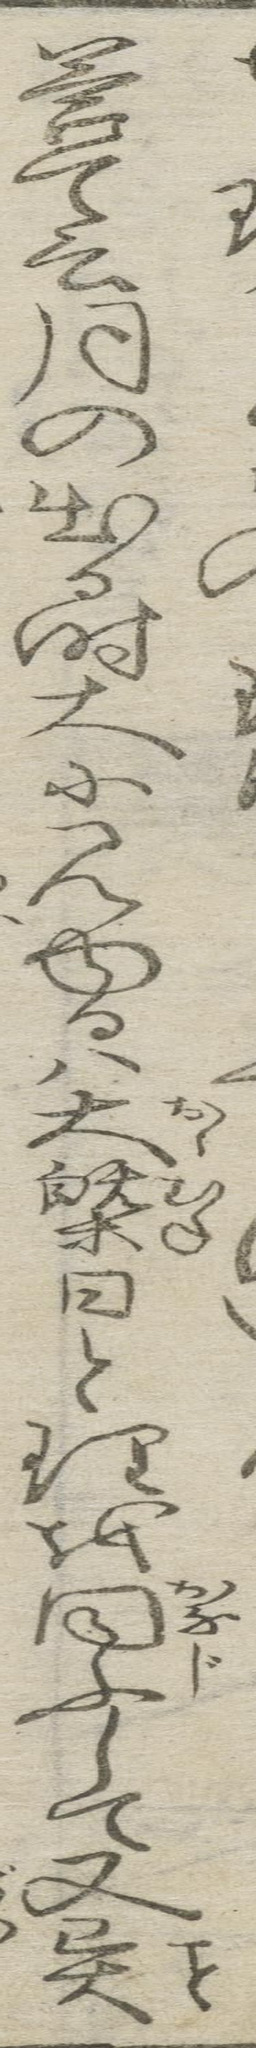答て云月の出る時大に見ゆるは大概日と理を同ふして又異
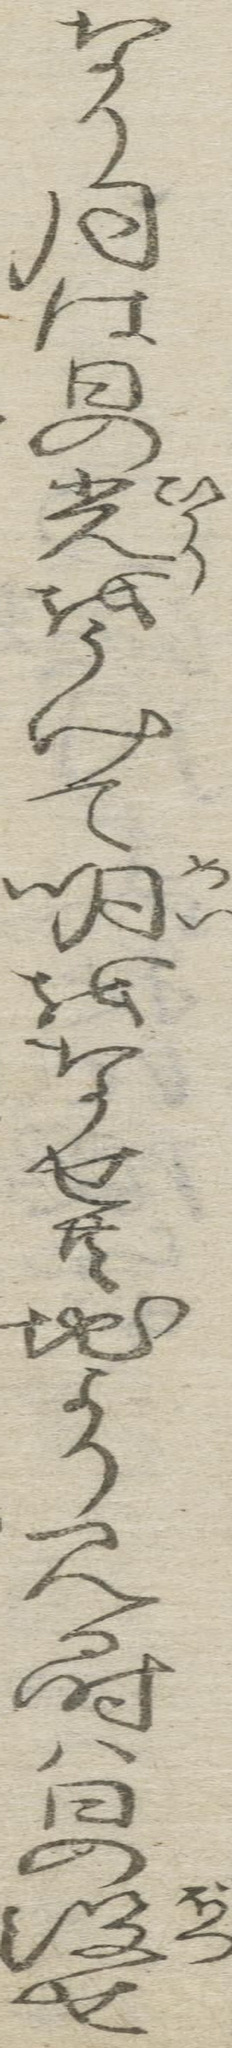なり月は日の光をうけて明をなせ共地より見る時は日の没せ
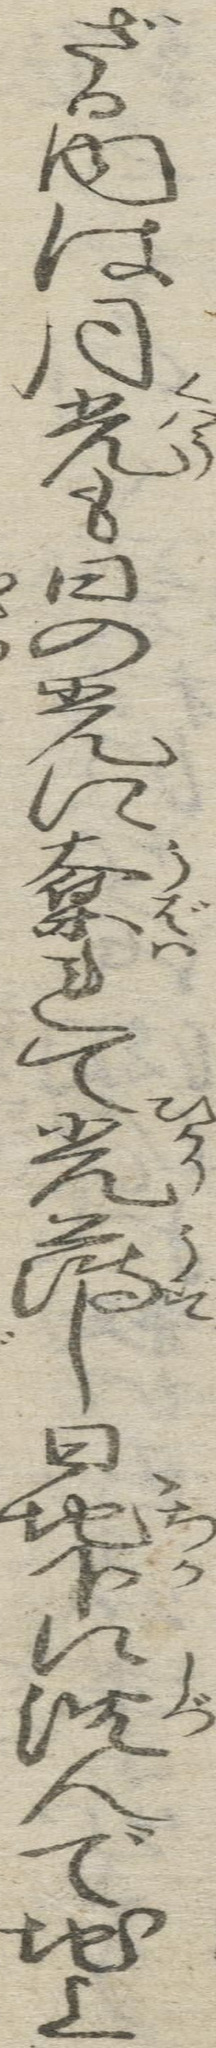ざる内は月光も日の光に奪れて光薄し日地下に沈んで地上
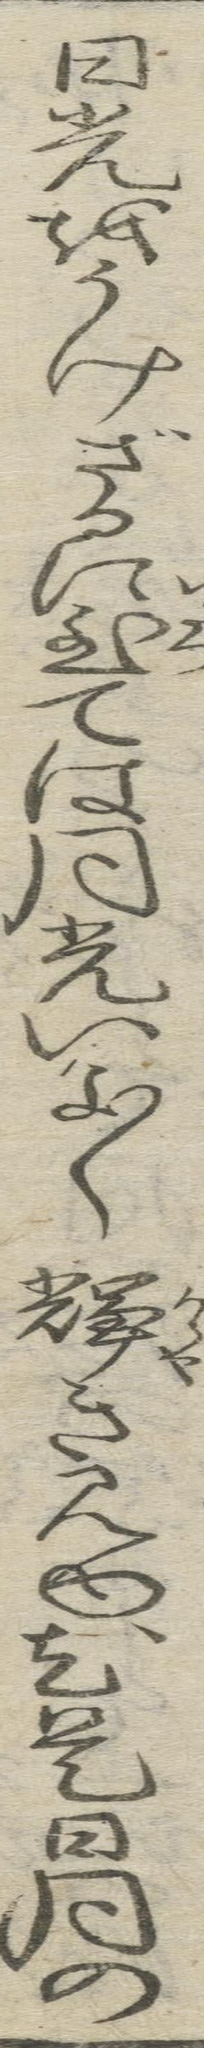日光をうけざるに至ては月光いよ〳〵輝き見ゆ尤是日月の
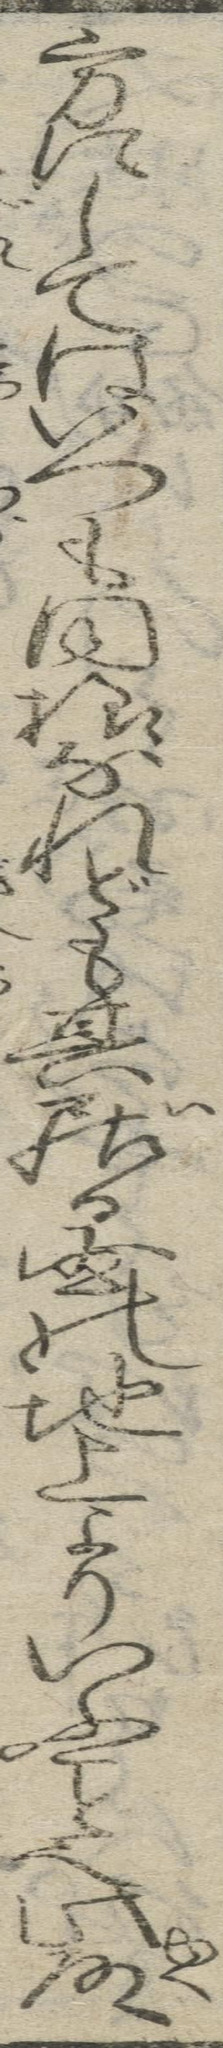方にしてはいつも同根なれども其居る国の地上よりいふこと也此故
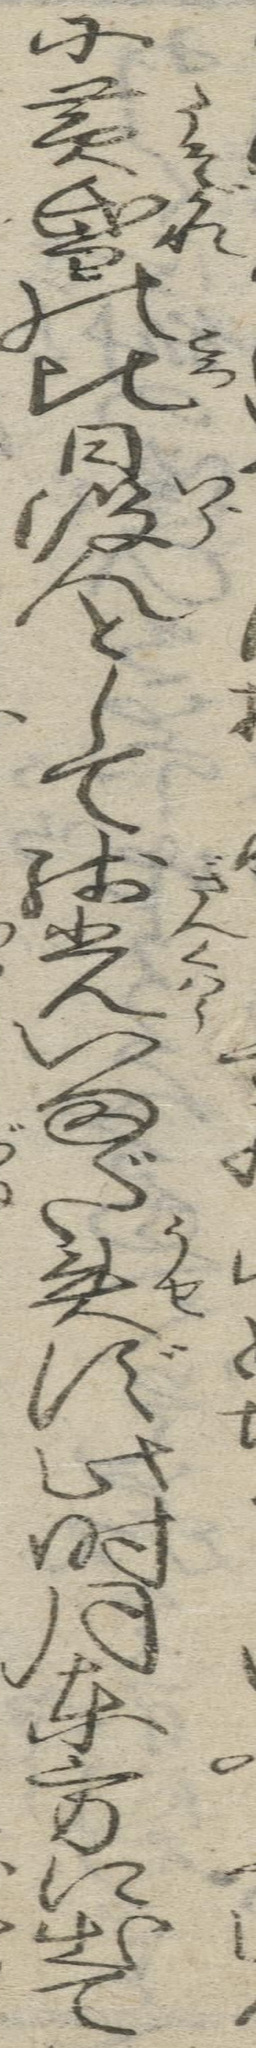に黄昏の比日没んとして残光いまだ失ず此時月東方に出て
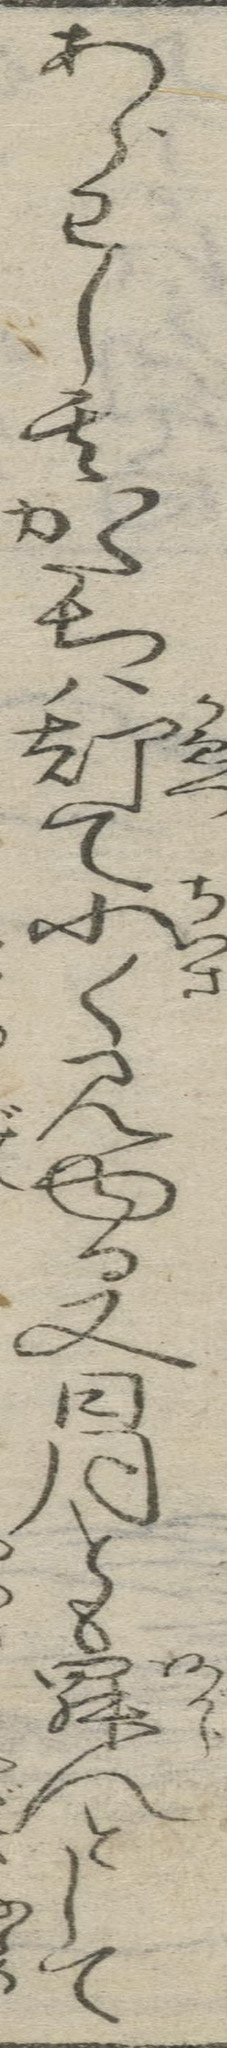あらわし其かたちは却て小く見ゆる又日月とも昇んとして
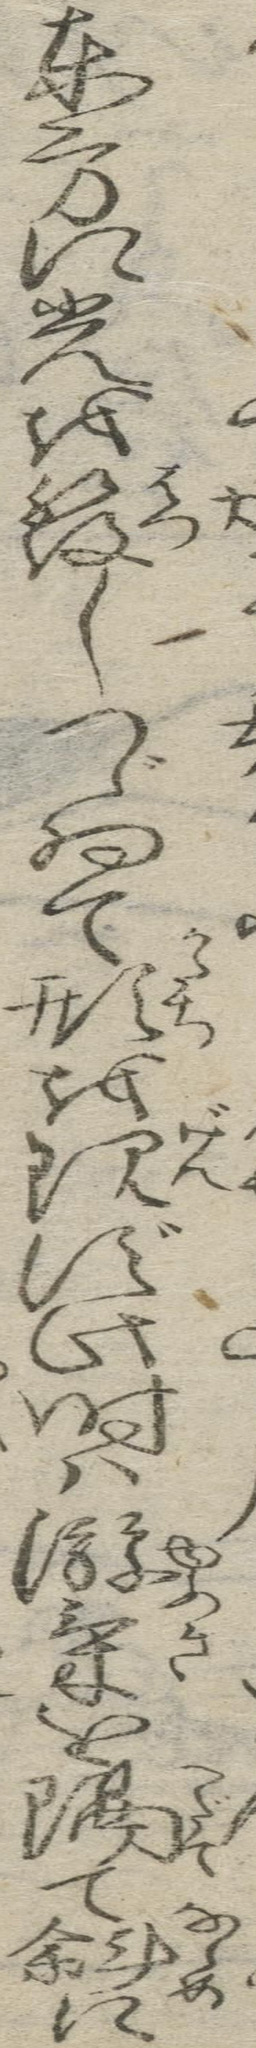東方に光を発しつゞゐて形を現ず此時は游気を隔て斜に
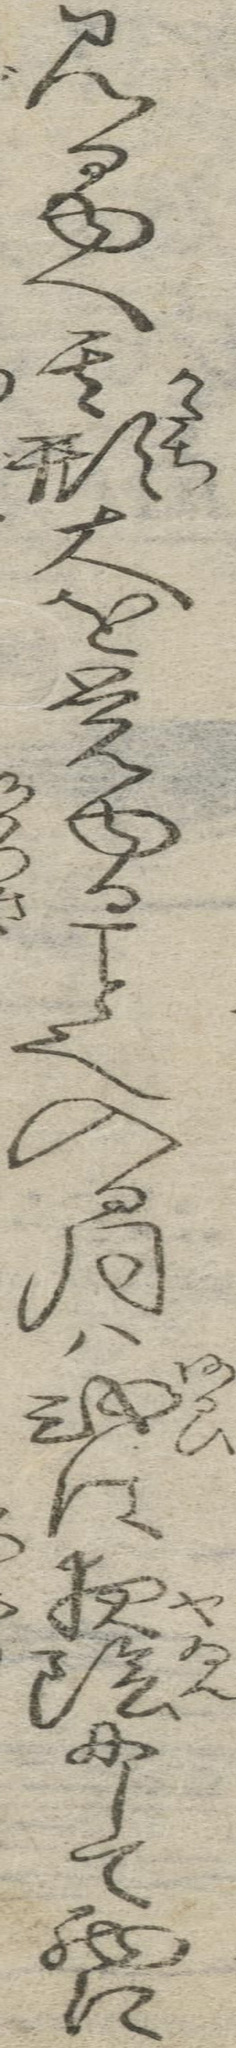見るゆへ其形大を覚ゆること也入る月は或は夜陰にして西に
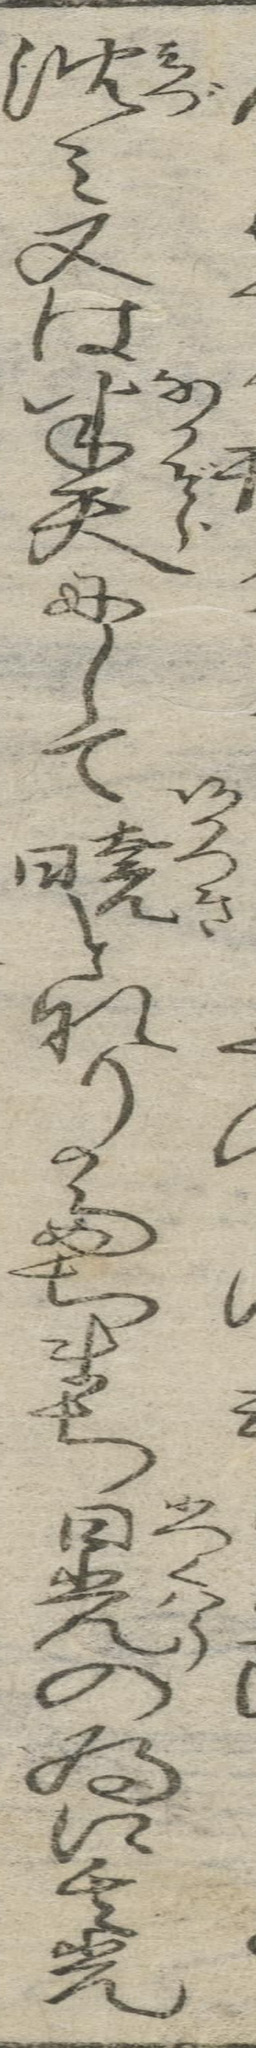沈み又は半天にして暁となりたちまち日光の為に其光
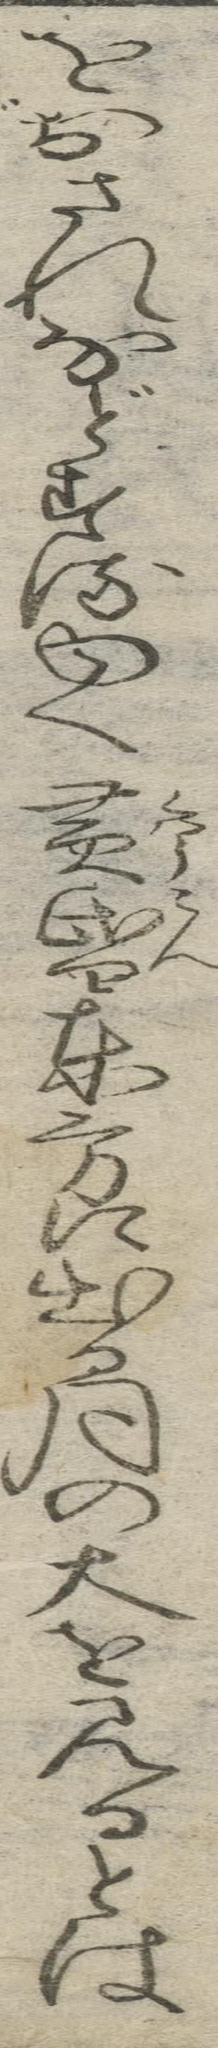をおされなどするゆへ黄昏東方に出る月の大を見るとは
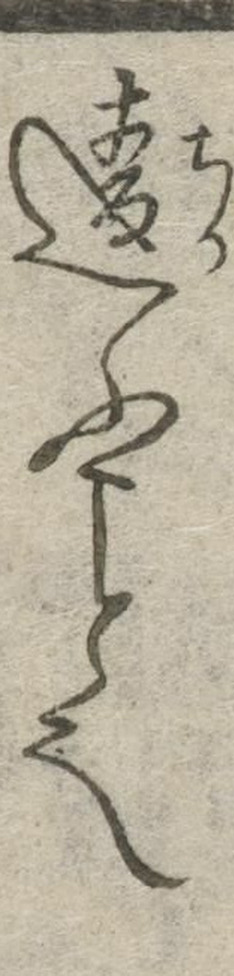違ふこと也
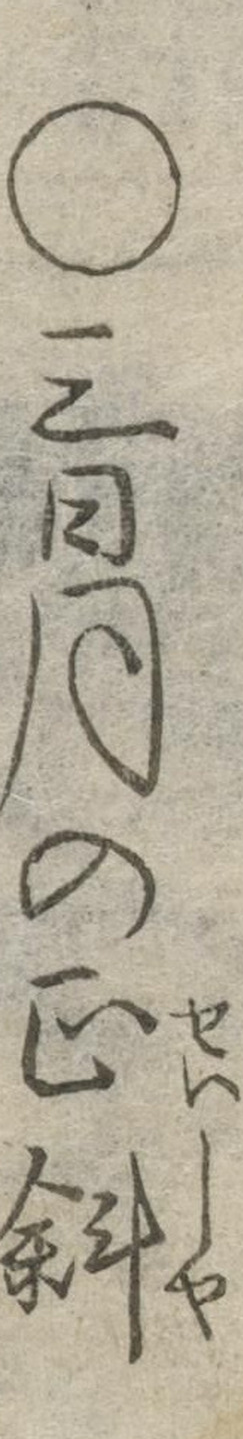○三日月の正射
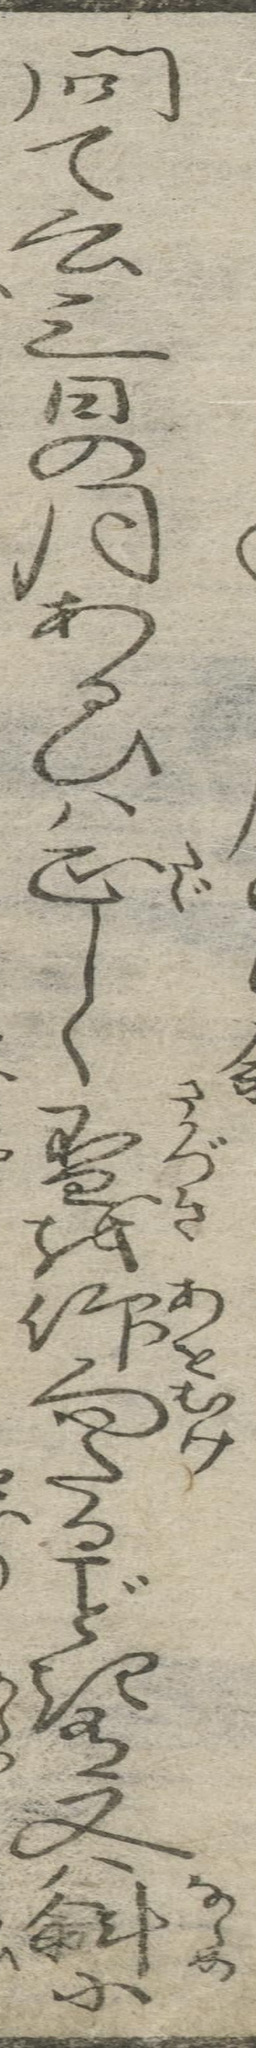問て云三日の月あるひは正しく盃を仰向たるごとき有又は斜に
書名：訓蒙天地辨　天
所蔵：東京大学地震研究所図書室 Earthquake Research Institute Library, The University of Tokyo, JAPAN
